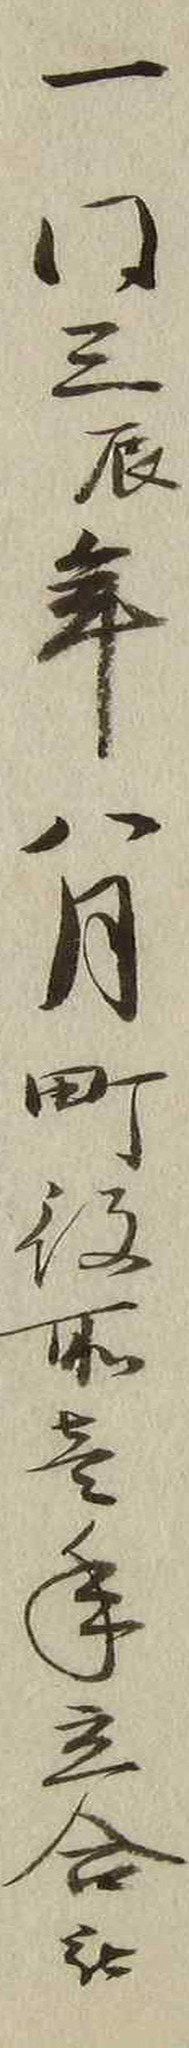一同三辰年八月町役所壱年立合被
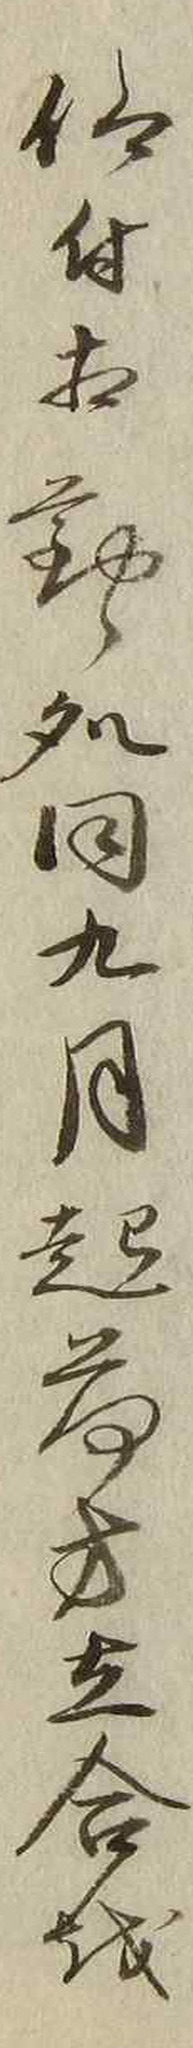仰付相勤候処同九月起荷方立合越
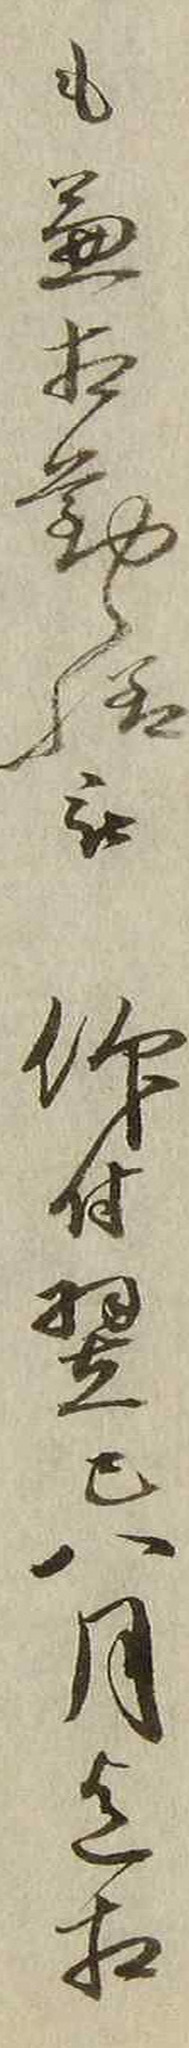も兼相勤候様被仰付翌巳八月迄相
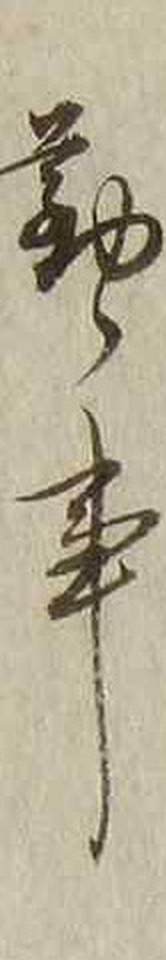勤候事
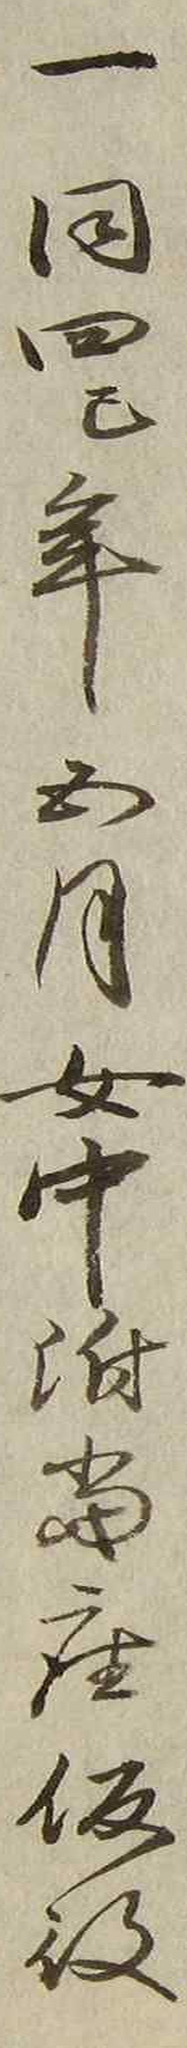一同四巳年五月女中附当座仮役
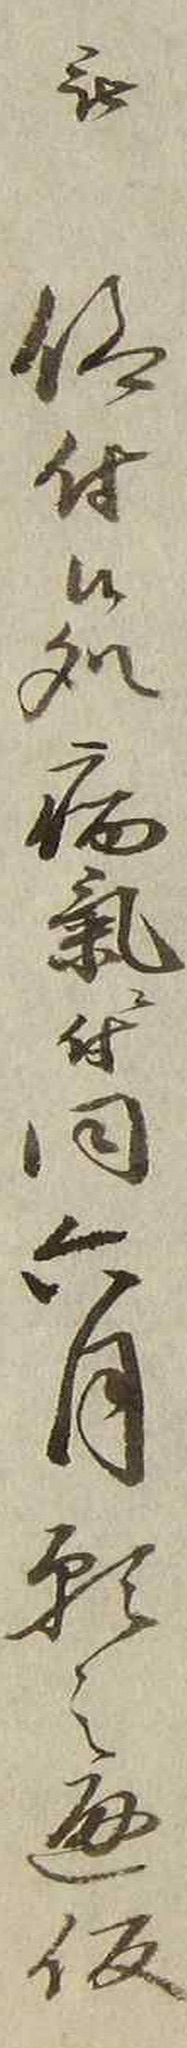被仰付候処病気ニ付同六月願之通仮
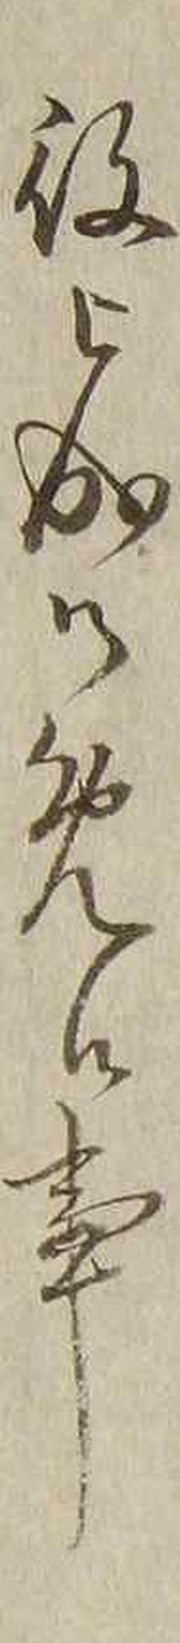役被成御免候事
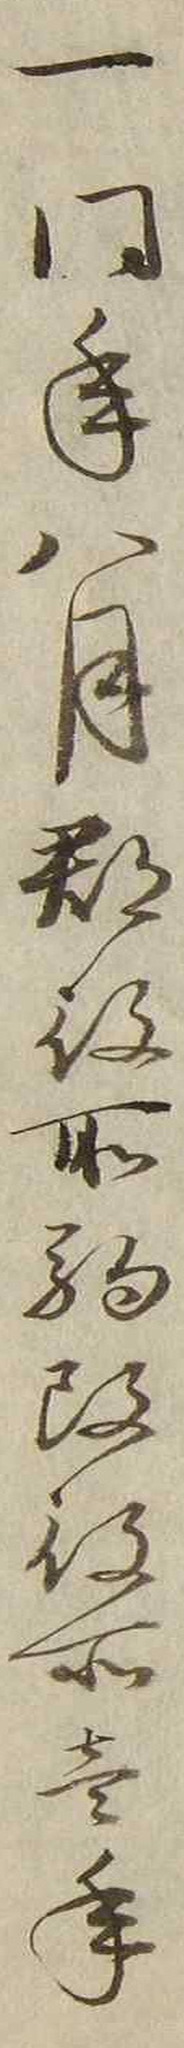一同年八月郡役所駒改役所壱年

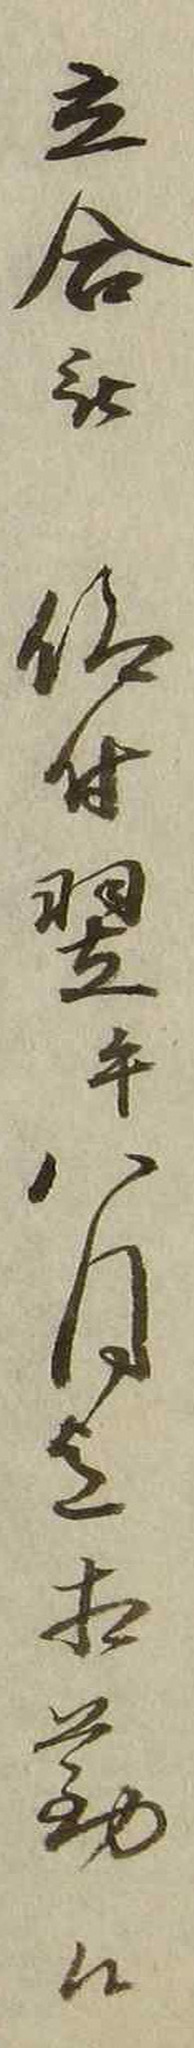立合被仰付翌午八月迄相勤候
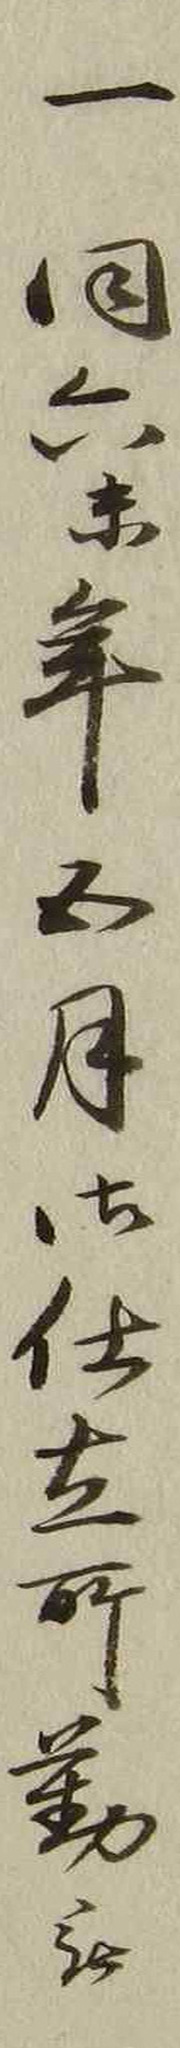一同六未年五月御仕立所勤被
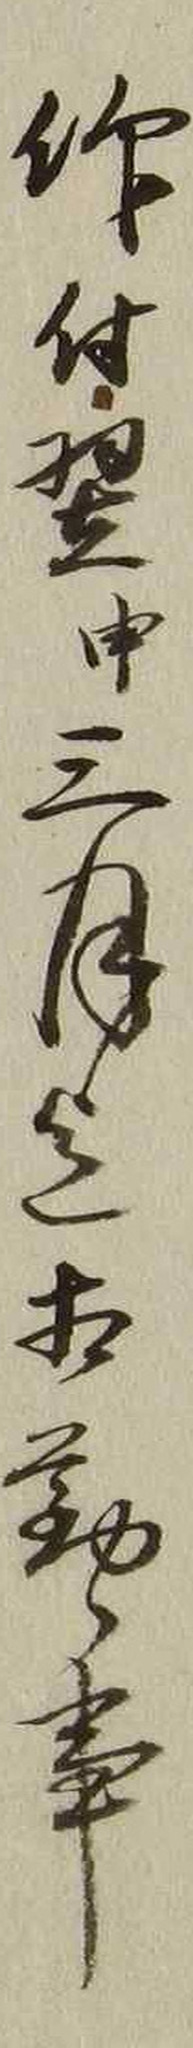仰付翌申三月迄相勤候事
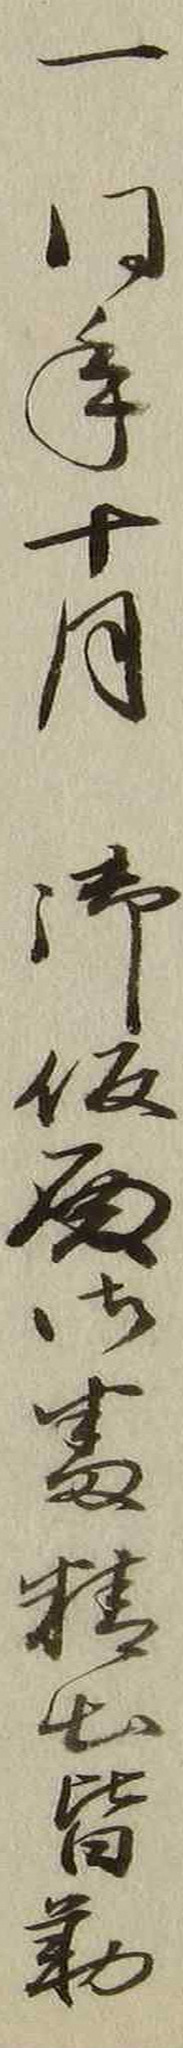一同年十月御仮殿御番精出皆勤
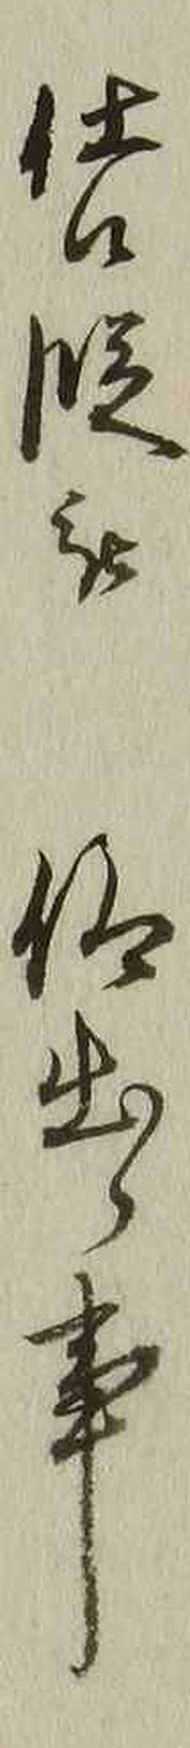仕候段被仰出候事
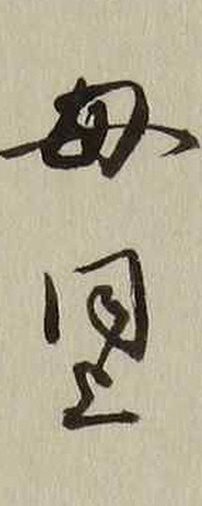母同上
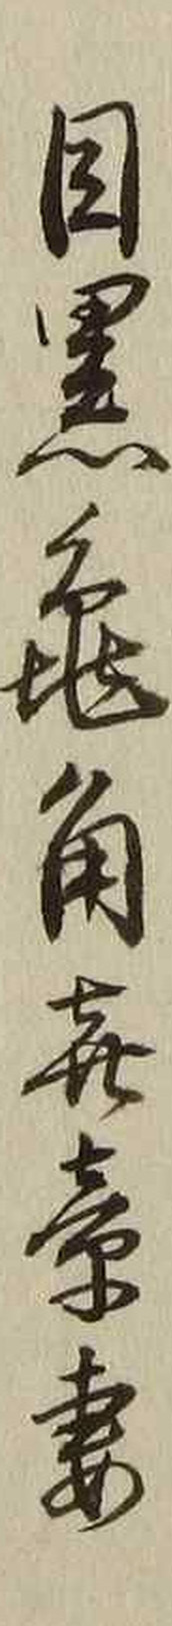女目黒亀角喜章妻
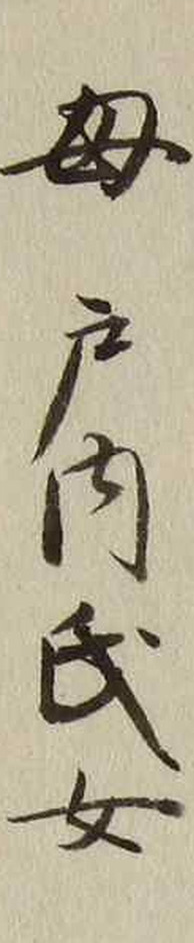母戸内氏女
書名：諸士系譜　巻之102　か之部10
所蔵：会津若松市立会津図書館
